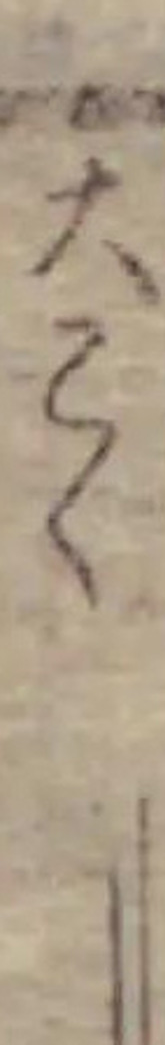大こく
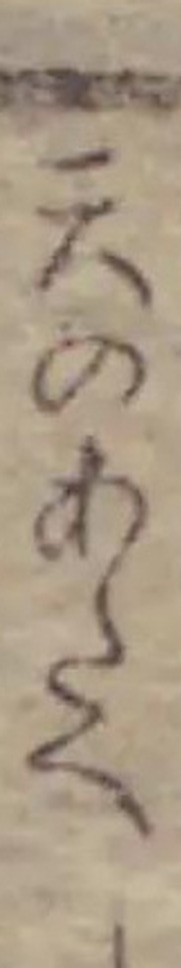天のあたへ
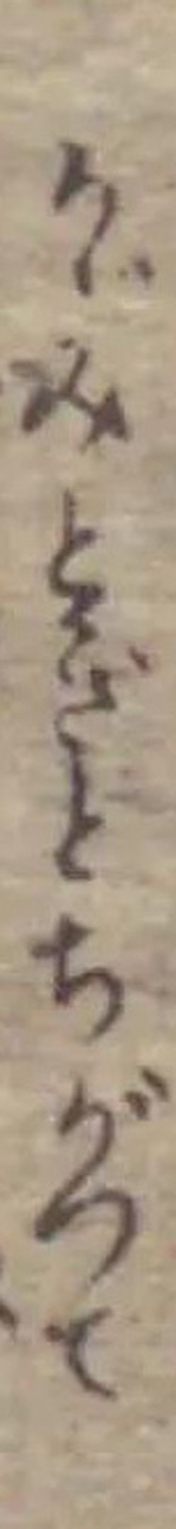かゞみとぎとちがつて
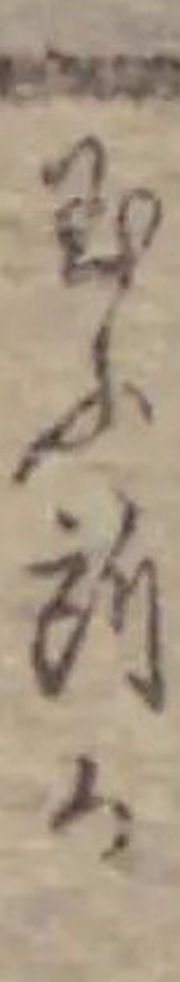玉ふ所か
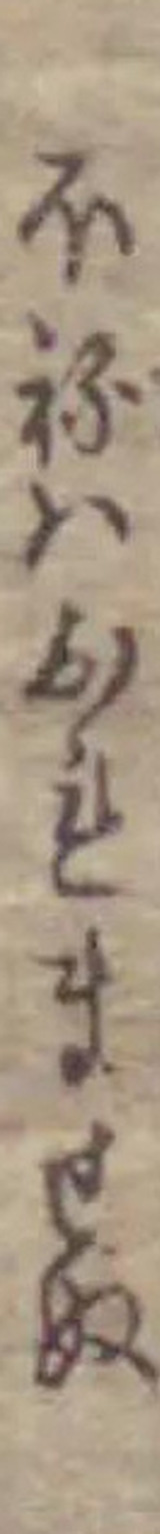ほねはおれませぬ
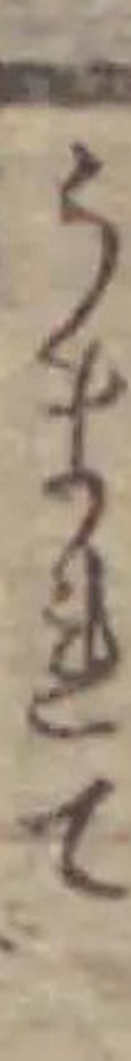うまれて
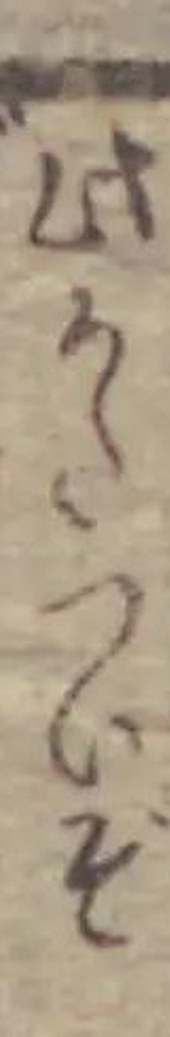此かたついぞ
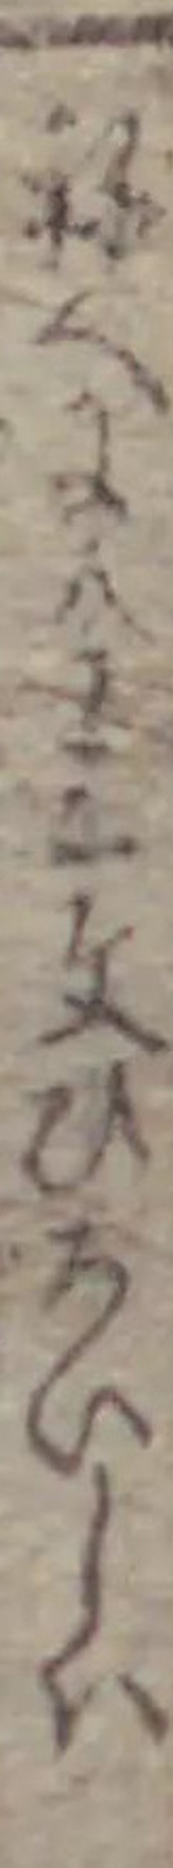ねへに今三文ひろいしは
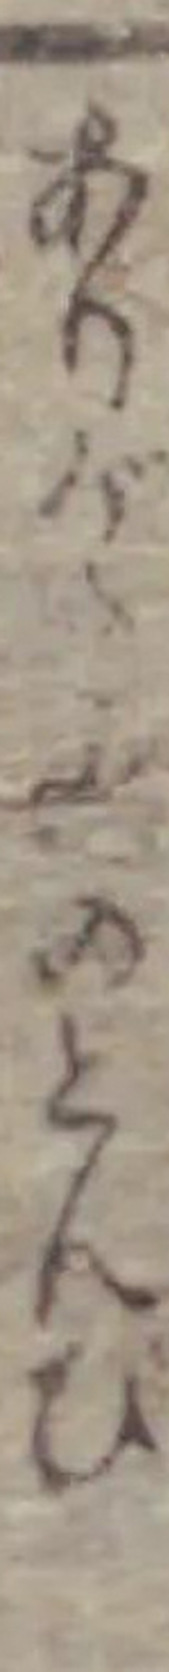ありがた山のとんび
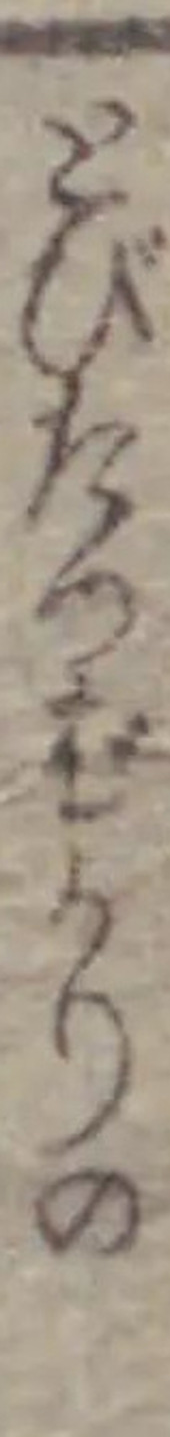とびたつばかりの
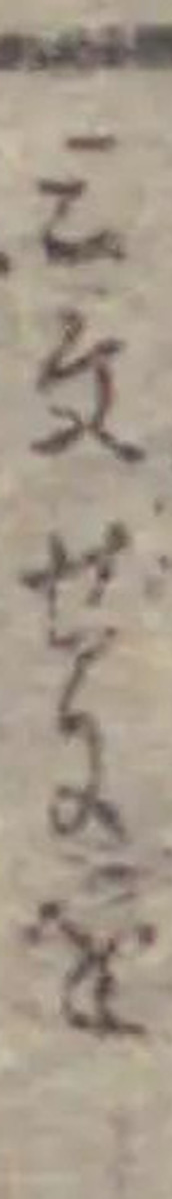三文ぜにを
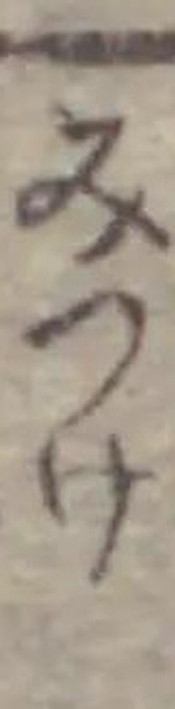みつけ
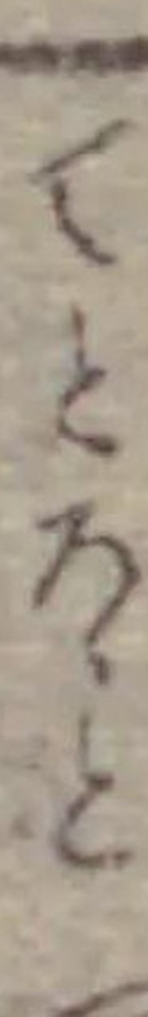てとろゝと
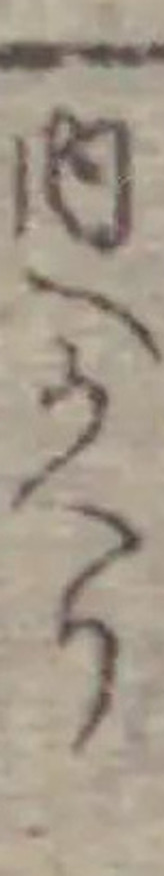内へかへり
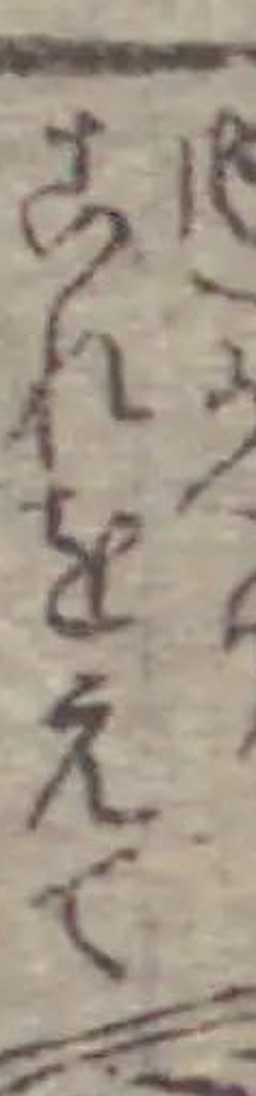これをえて
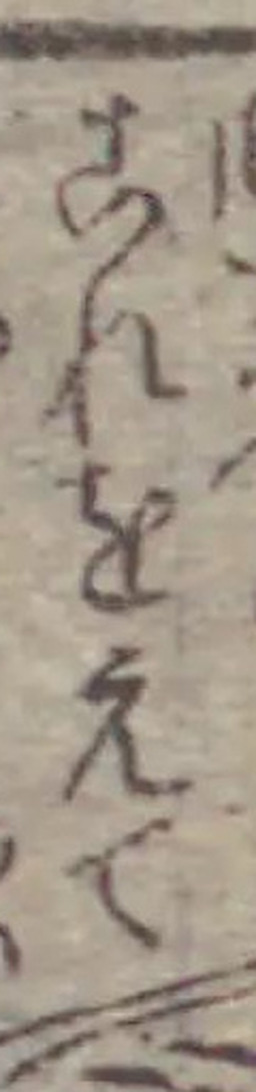これをえて
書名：栄増眼鏡徳 3巻
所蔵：国立国会図書館 National Diet Library, JAPAN
